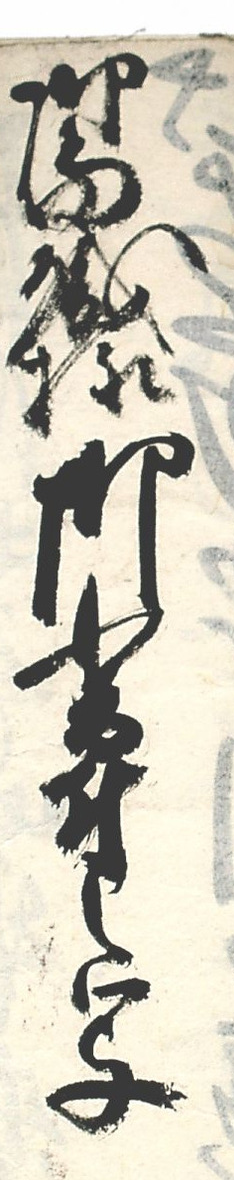御当職様御書付之写

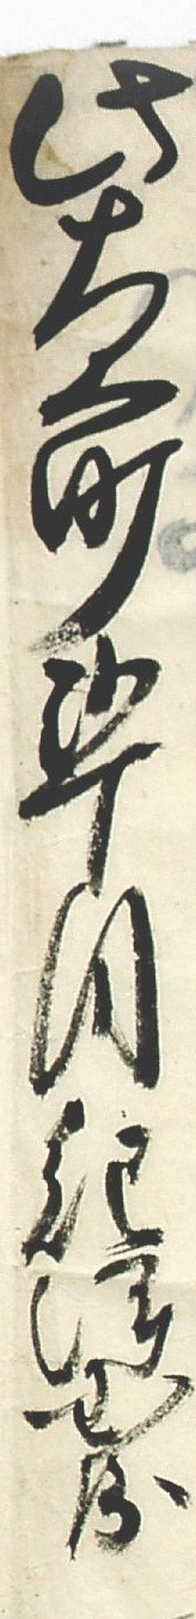此大工町弐丁目紀伊国屋
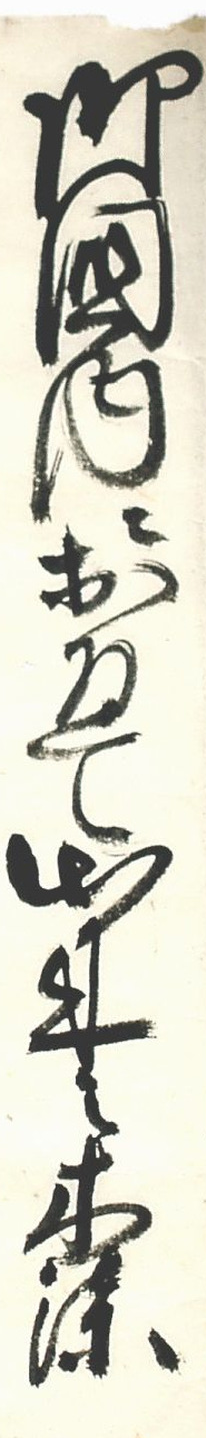御国内におゐて出来候木漆
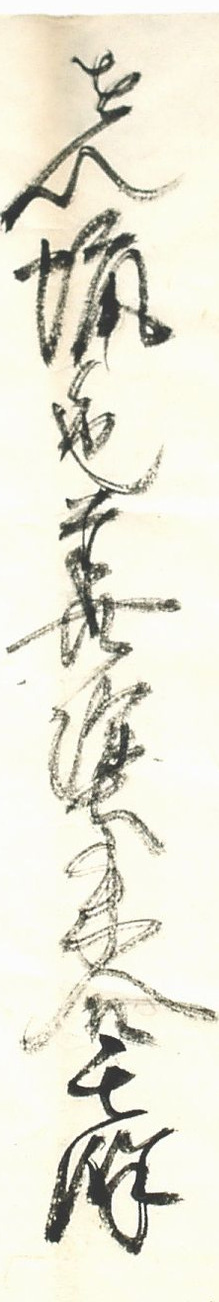を以蝋色華塗朱合其余
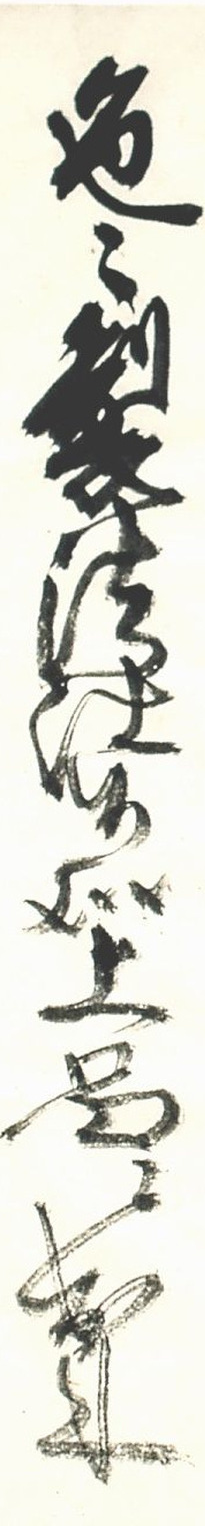色々製法仕候処上図に出来
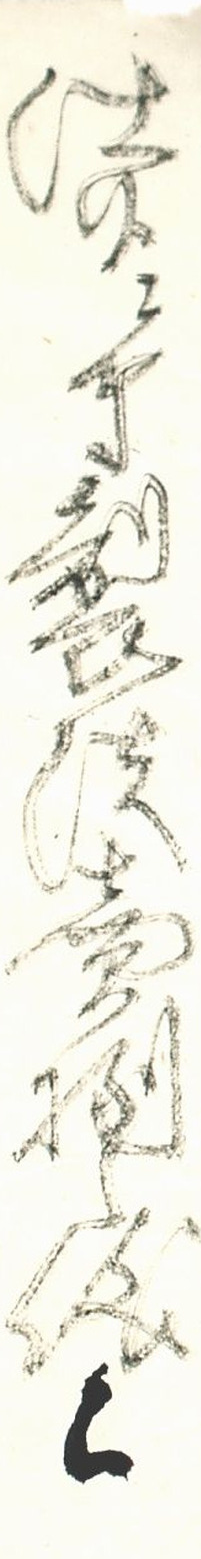仕候に付製法売捌之儀被
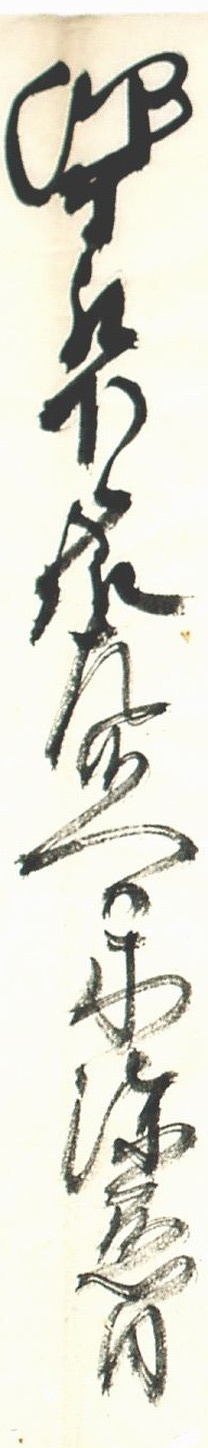仰付被下候様左候へは木漆懸目
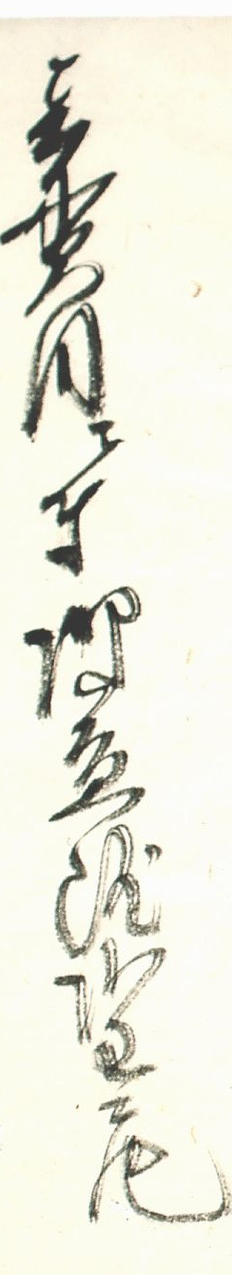壱貫目に付御益銀弐匁宛
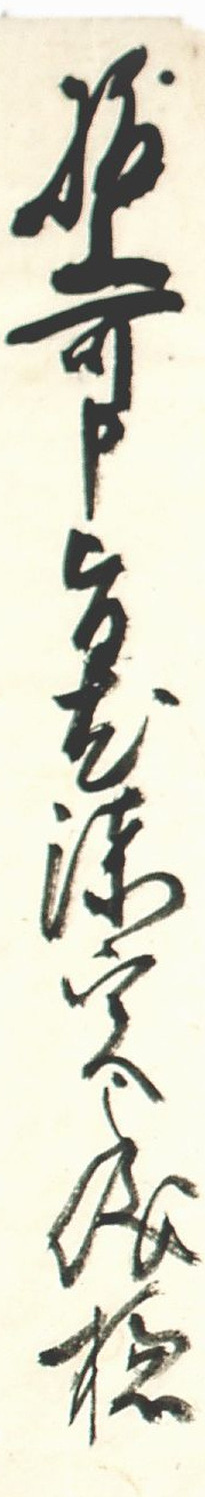指上可申上旨尤漆実之儀櫨
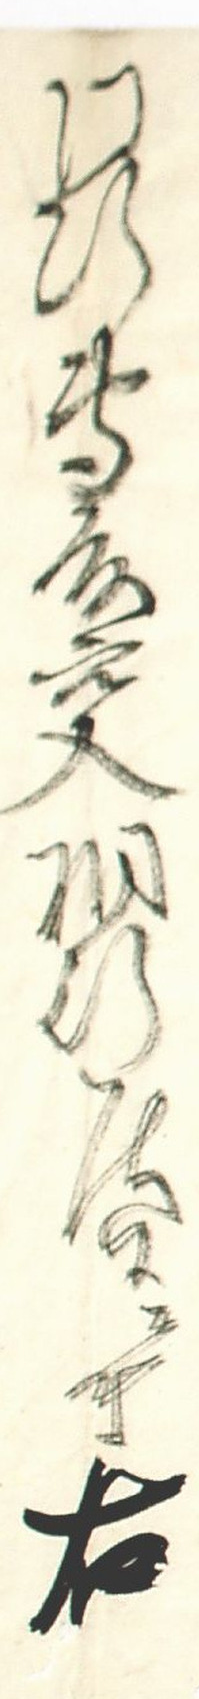同断専取交相行居候に付右
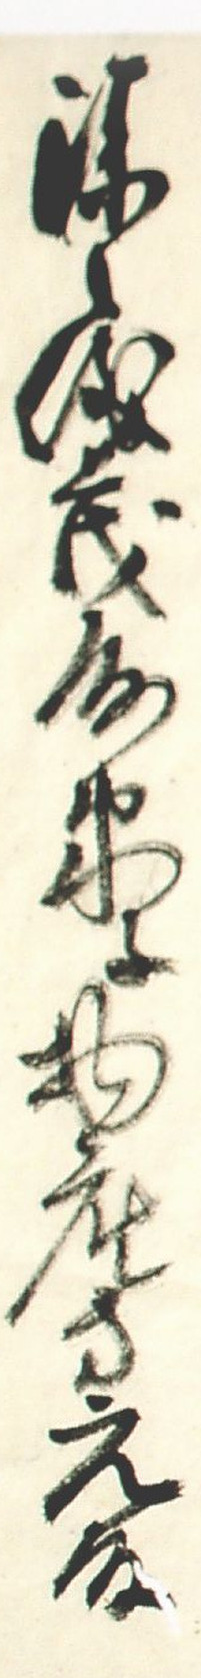漆之儀も取束ね物産方元取
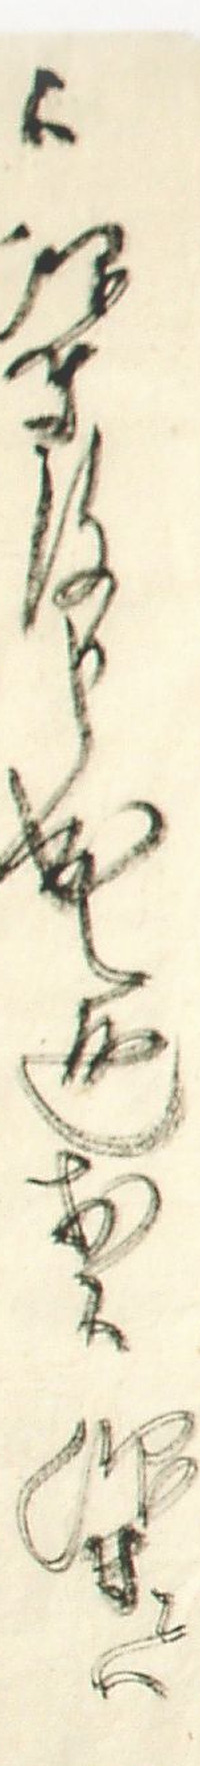被仰付度申出候通於被仰付には

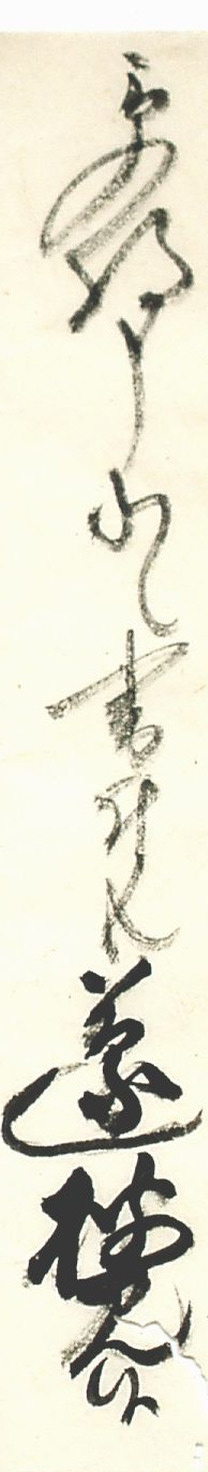受持申出候書付共遂披見候
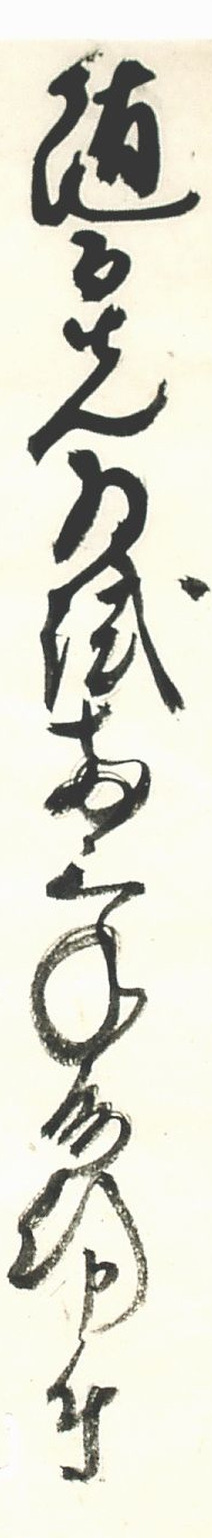随而先為試両三年取行申付
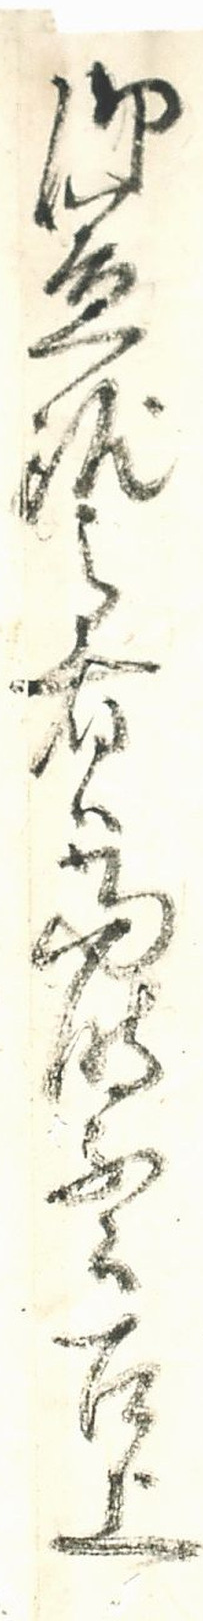御益銀之者は当時不被召上
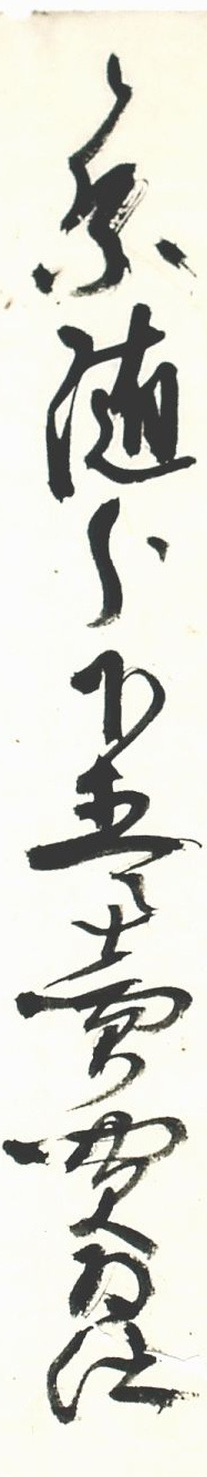候条随分下直に売買為仕
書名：申上覚（漆からろう製成及売捌きについて）
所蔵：鳴門教育大学 Naruto University of Education
